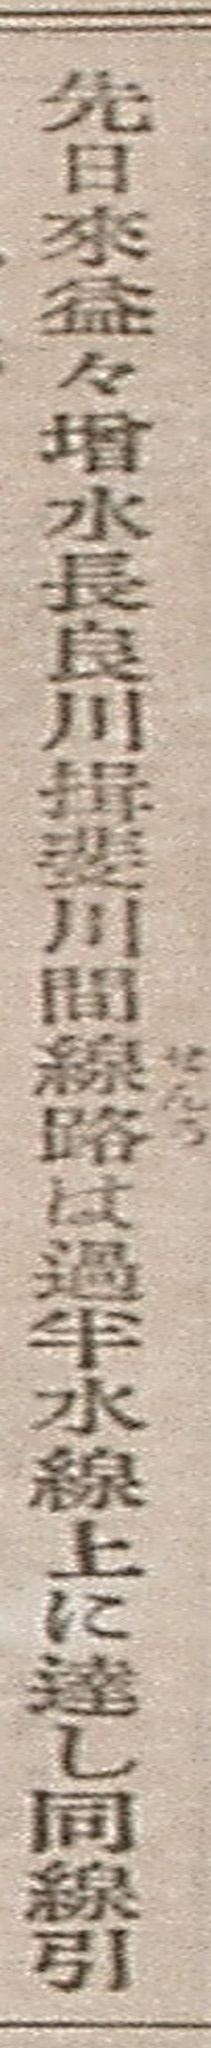先日来益々増水長良川揖斐川間線路は過半水線上に達し同線引
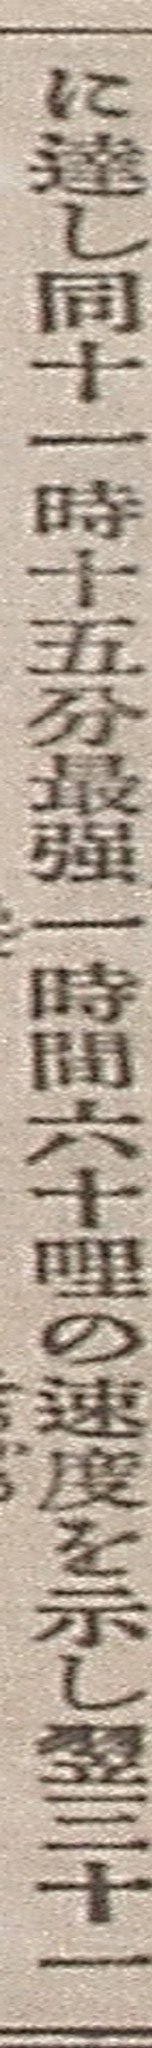に達し同十一時十五分最強一時間六十哩の速度を示し翌三十一
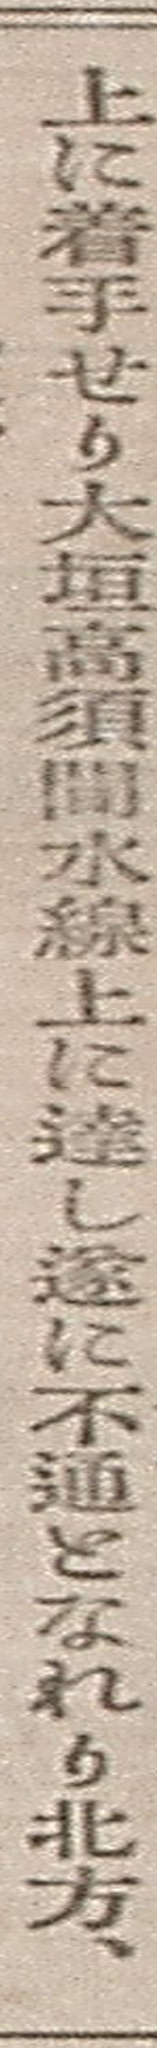上に着手せり大垣高須間水線上に達し遂に不通となれり北方、
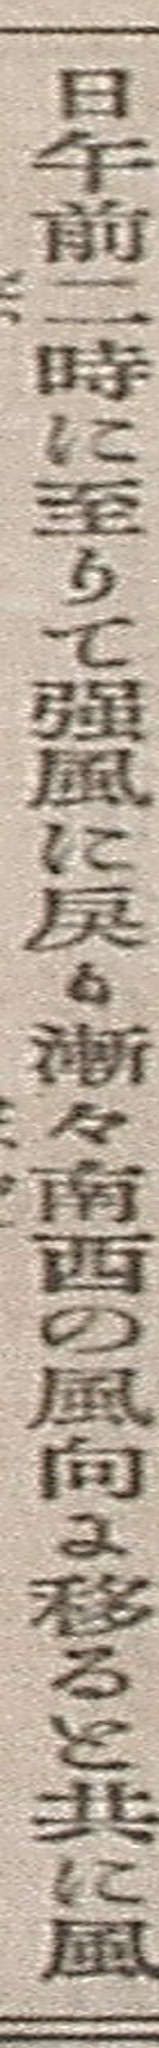日午前二時に至りて強風に戻り漸々南西の風向に移ると共に風
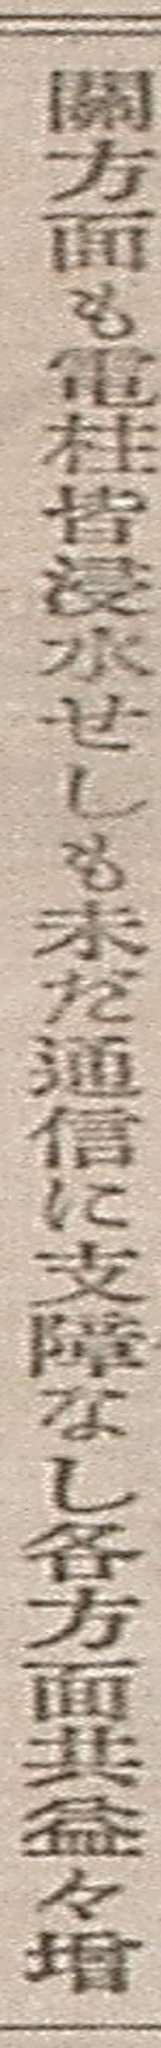関方面も電柱皆浸水せしも未だ通信に支障なし各方面共益々増
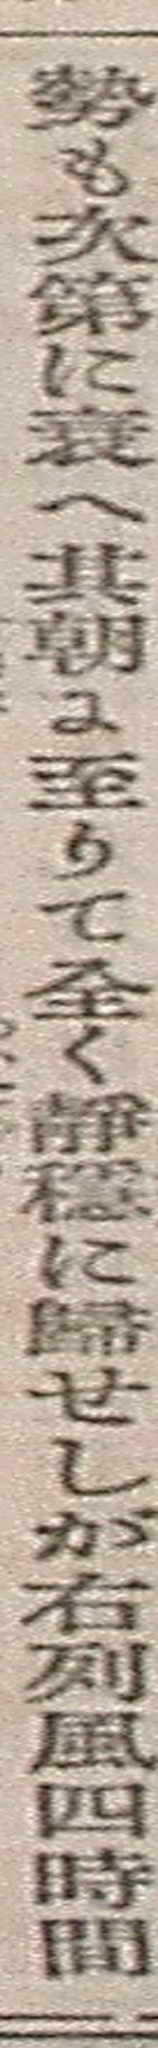勢も次第に衰へ其朝に至りて全く静穏に帰せしが右烈風四時間
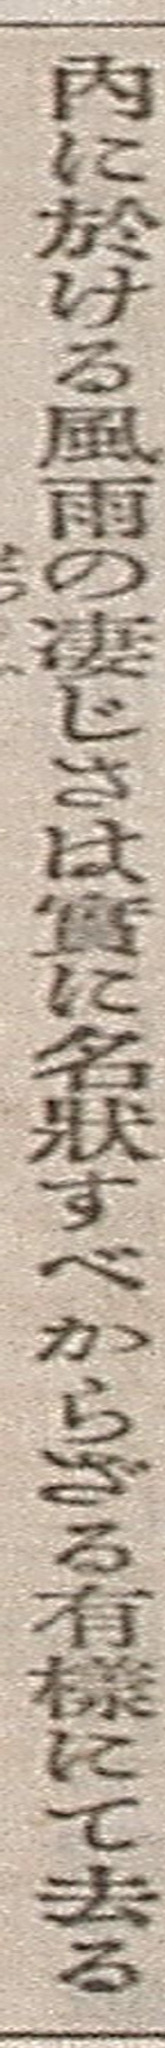内に於ける風雨の凄じさは実に名状すべからざる有様にて去る
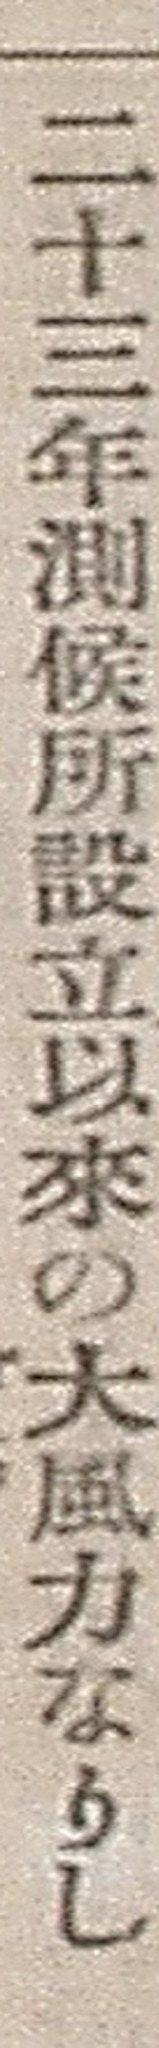二十三年測候所設立以来の大風力なりし
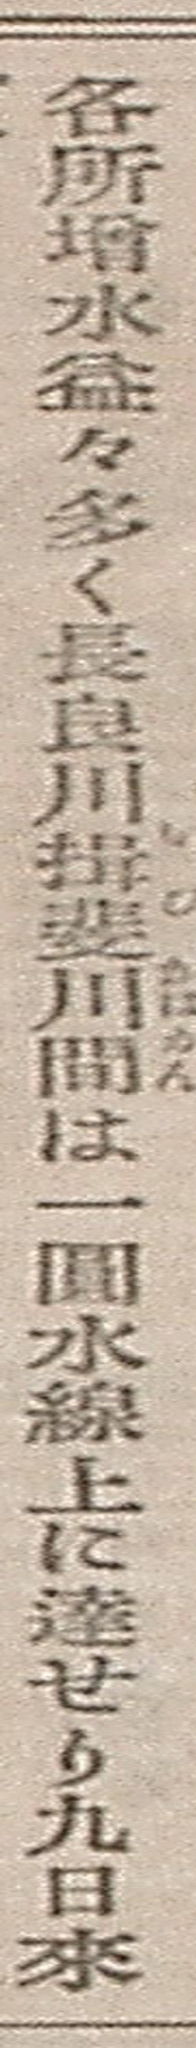各所増水益々多く長良川揖斐川間は一円水線上に達せり九日來
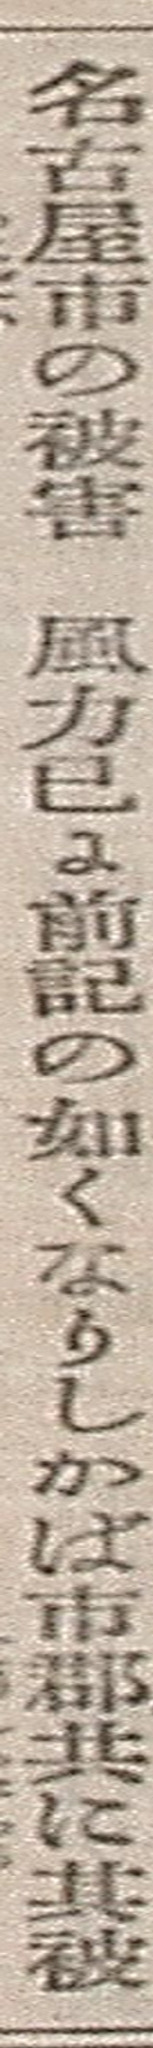名古屋市の被害風力已に前記の如しなりしかば市郡共に其被
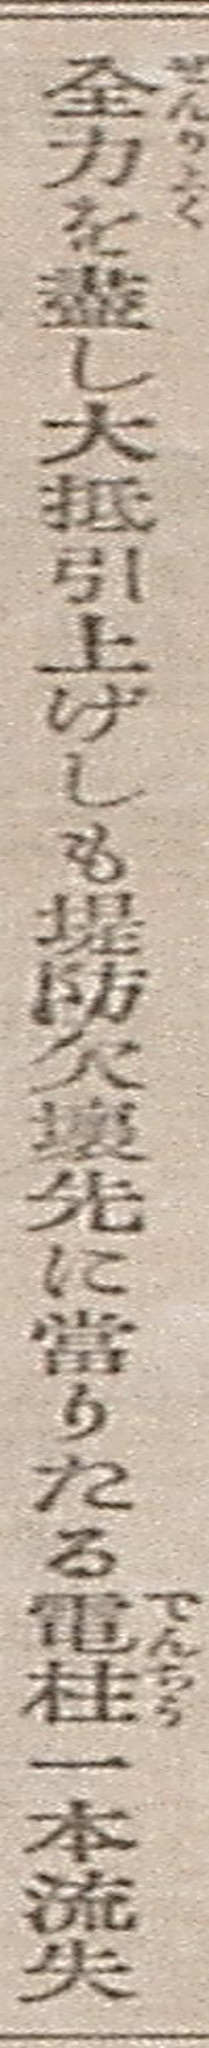全力を盡し大抵引上げしも堤防决壊先に当りたる電柱一本流失
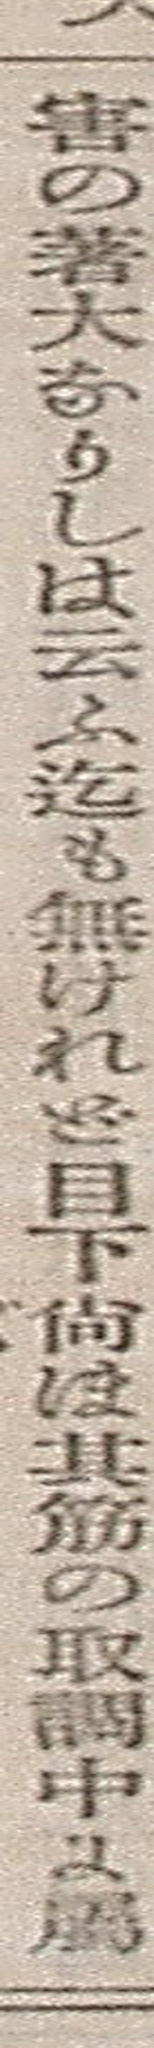害の著大なりしは云ふ迄も無けれど目下尚ほ其筋の取調中に属
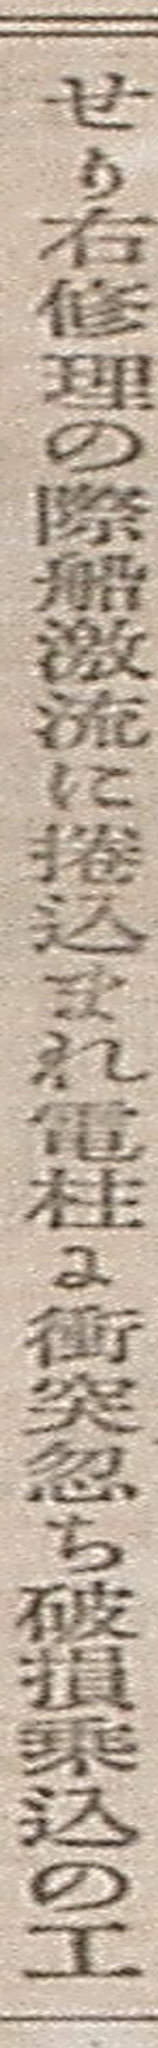せり右修理の際船激流に捲込れ電柱に衝突忽ち破損乗込の工
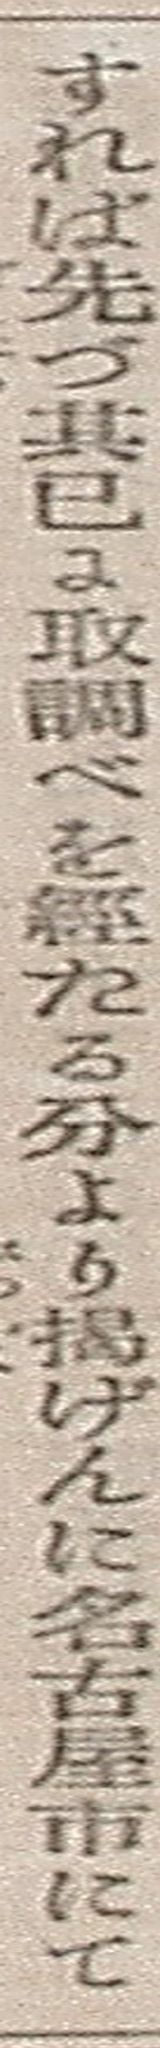すれば先づ其已に取調べを経たる分より掲げんに名古屋市にて
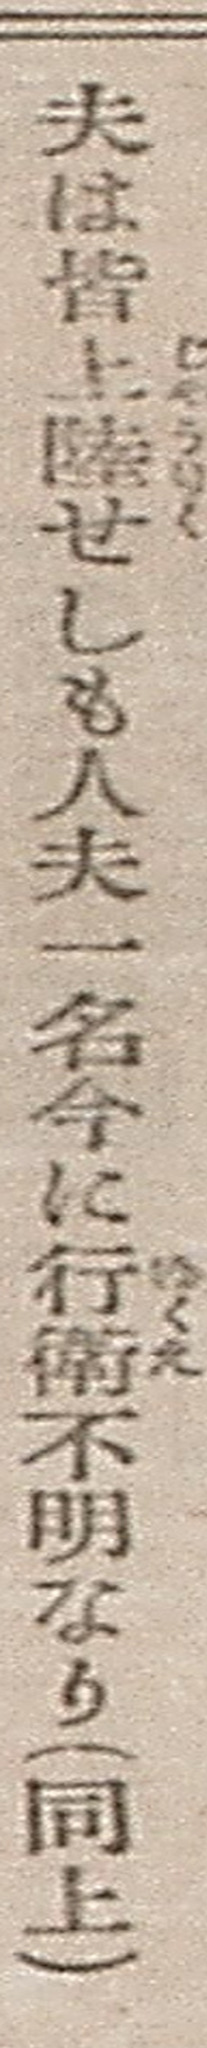夫は皆上陸せしも人夫一名今に行衛不明なり
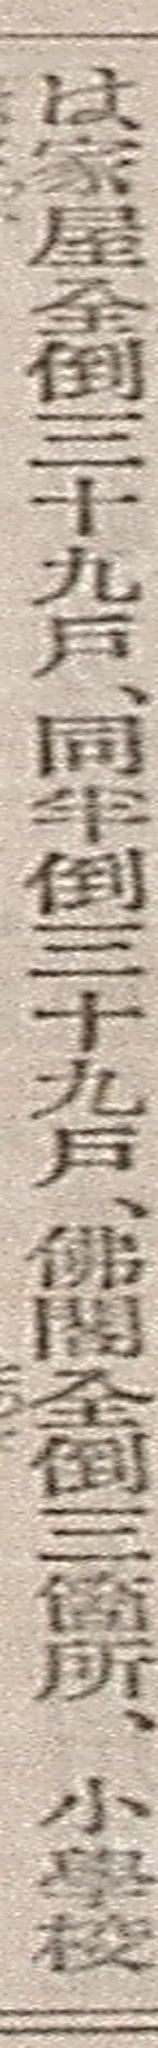は家屋全倒三十九戸、同半倒三十九戸、仏閣全倒三箇所、小学校
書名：風俗畫報臨時増刊第百二十六號　洪水被害録（中）
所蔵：東京大学地震研究所図書室 Earthquake Research Institute Library, The University of Tokyo, JAPAN
